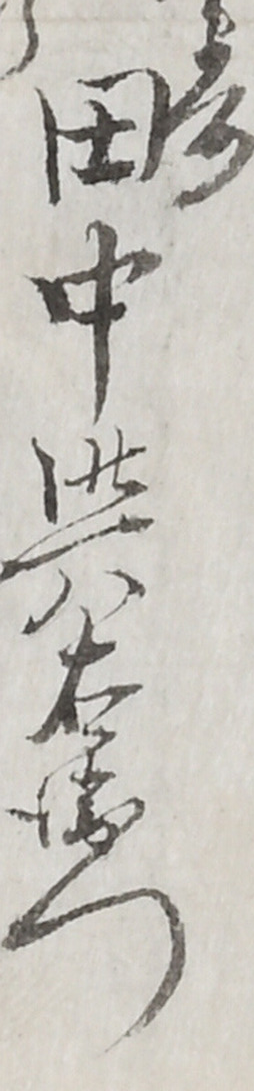田中与右衛門
